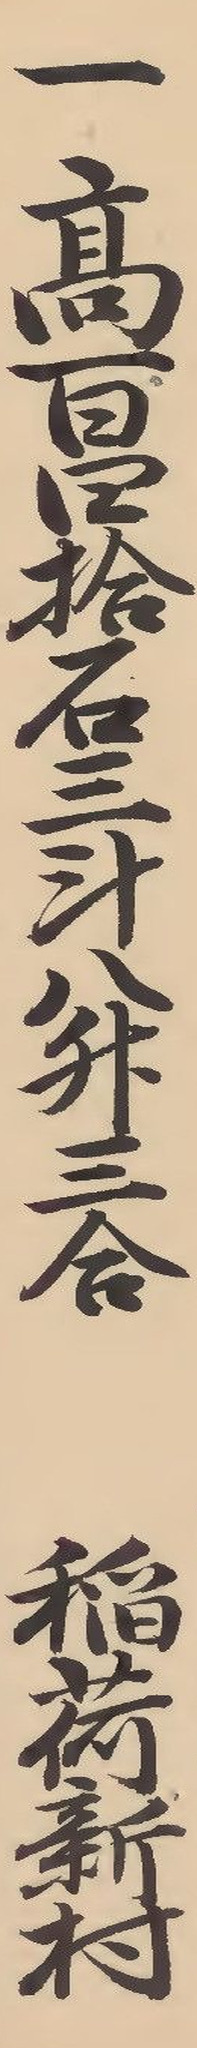一高百四拾石三斗八升三合稲荷新村
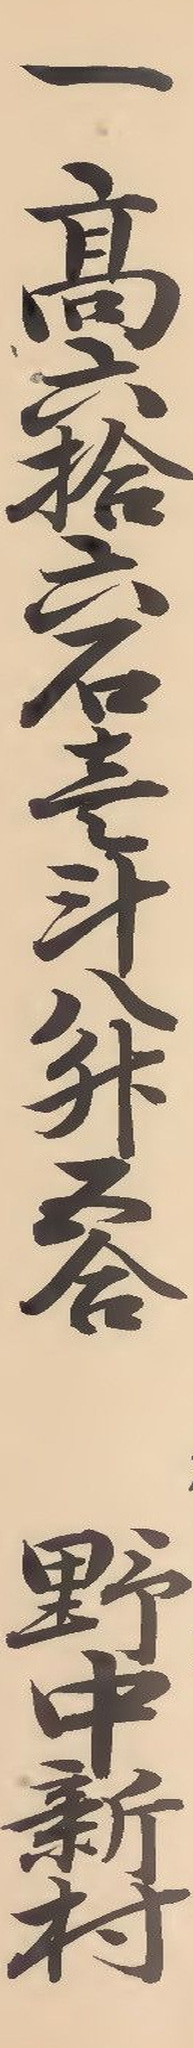一高六拾六石壱斗八升五合野中新村
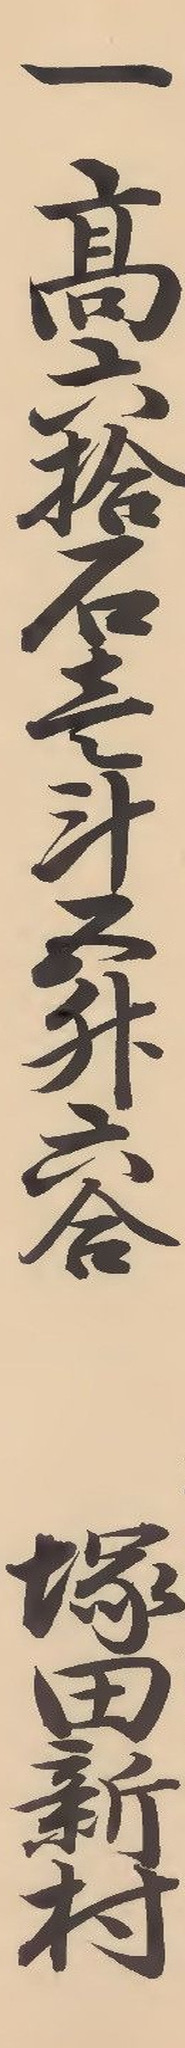一高六拾石壱斗五升六合塚田新村
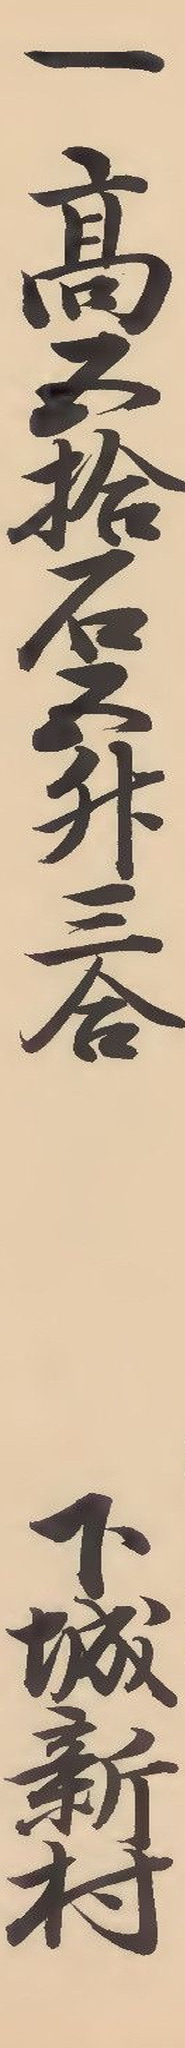一高五拾石五升三合下城新村
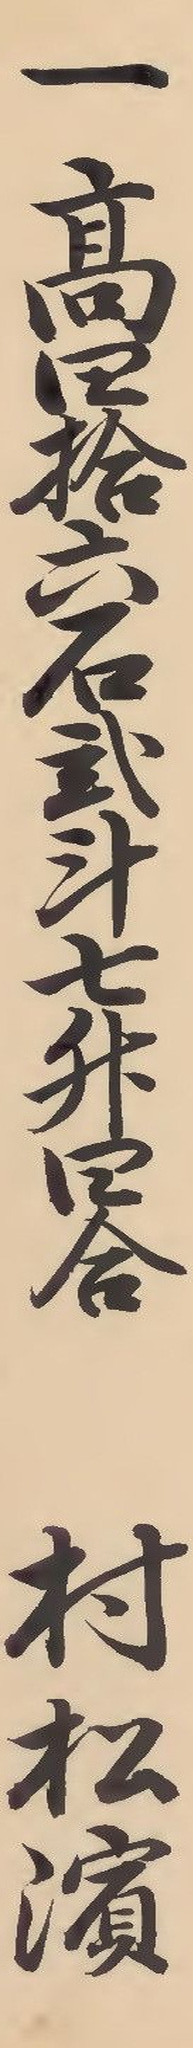一高四拾六石弐斗七升四合村松浜

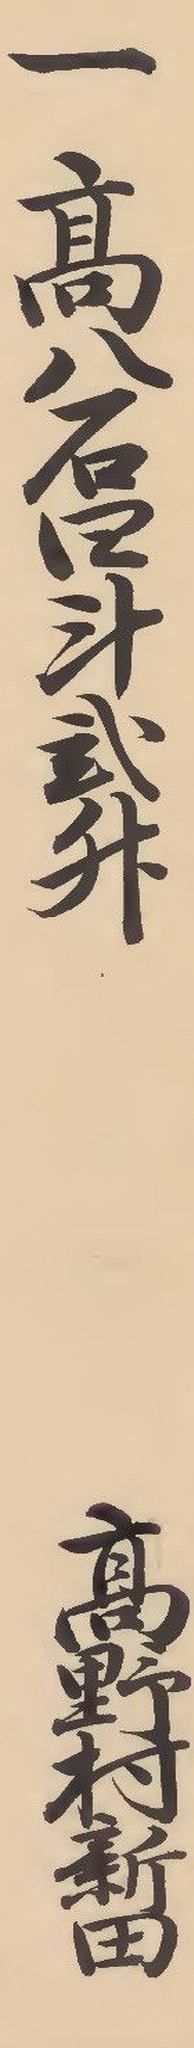一高八石四斗弐升高野村新田
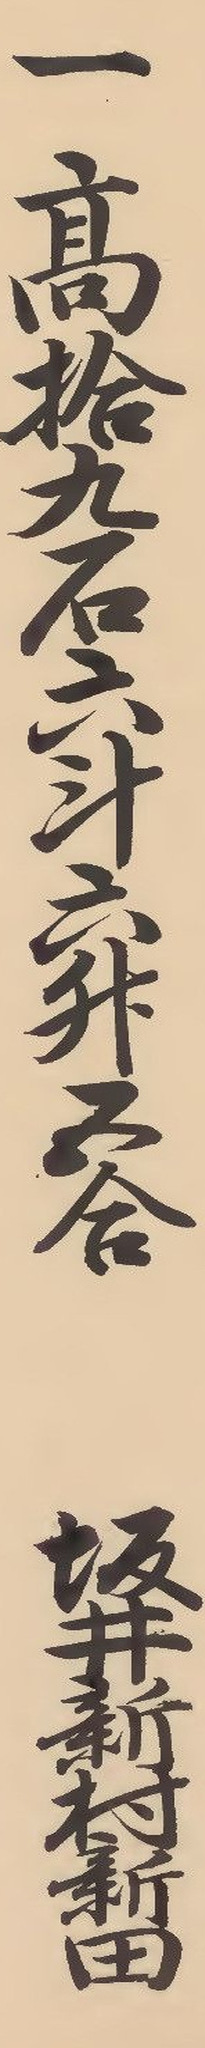一高拾九石六斗六升五合坂井新村新田
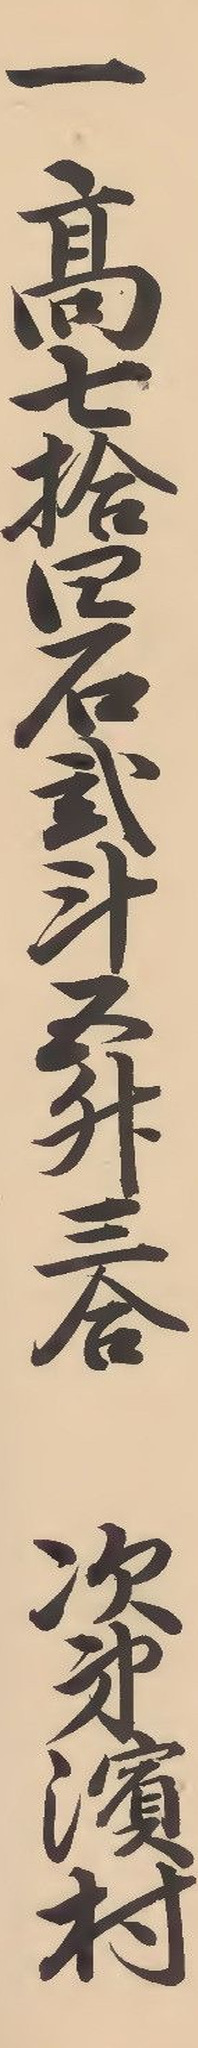一高七拾四石弐斗五升三合次第浜村
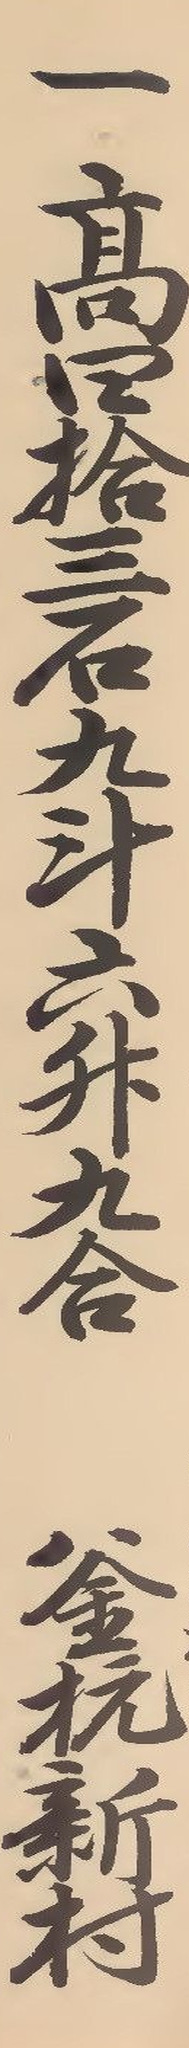一高四拾三石九斗六升九合釜杭新村
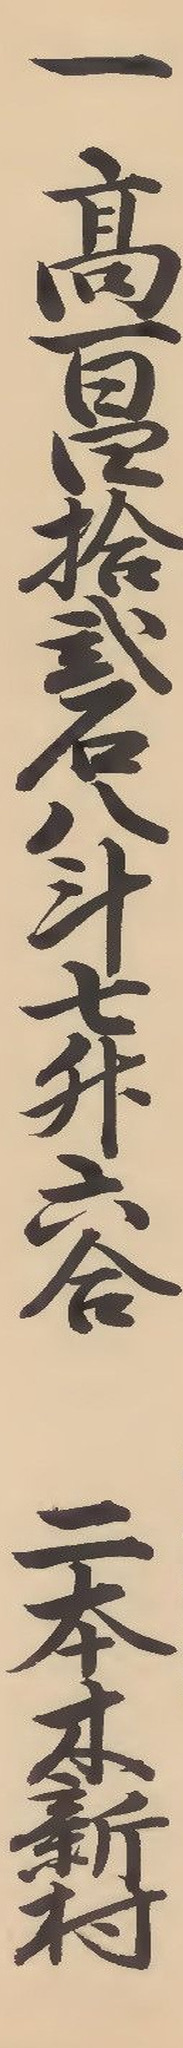一高百四拾弐石八斗七升六合二本木新村
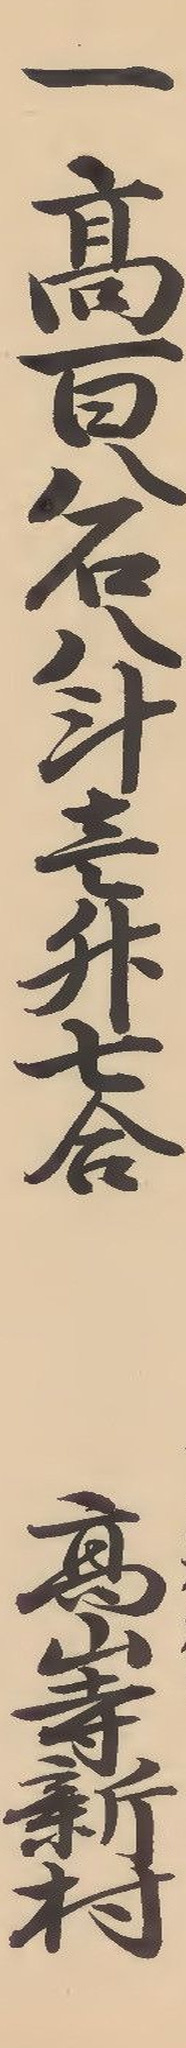一高百八石八斗壱升七合高山寺新村
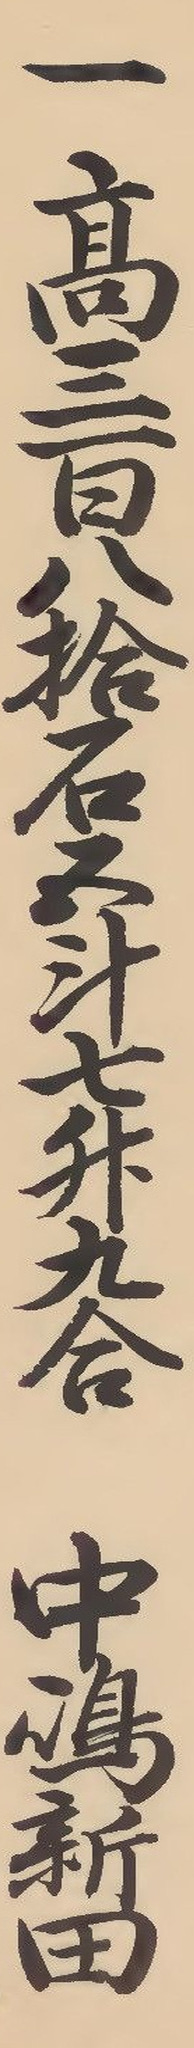一高三百八拾石五斗七升九合中島新田

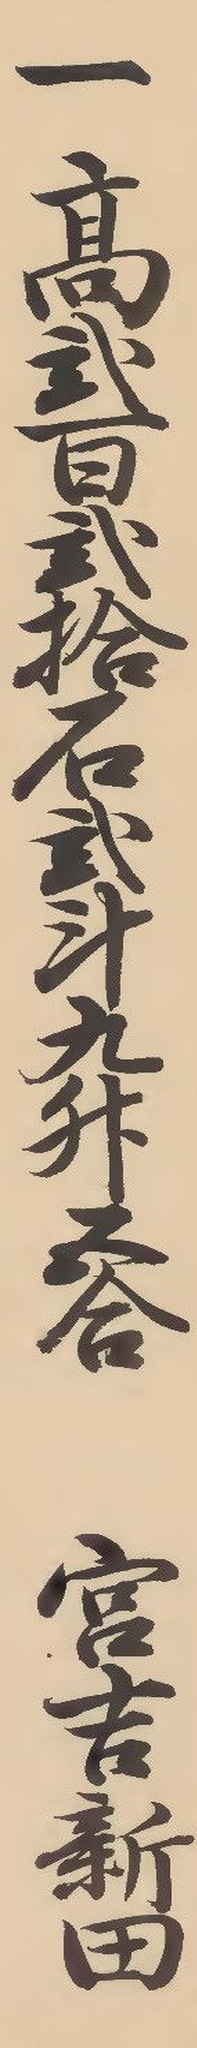一高弐百弐拾石弐斗九升五合宮吉新田
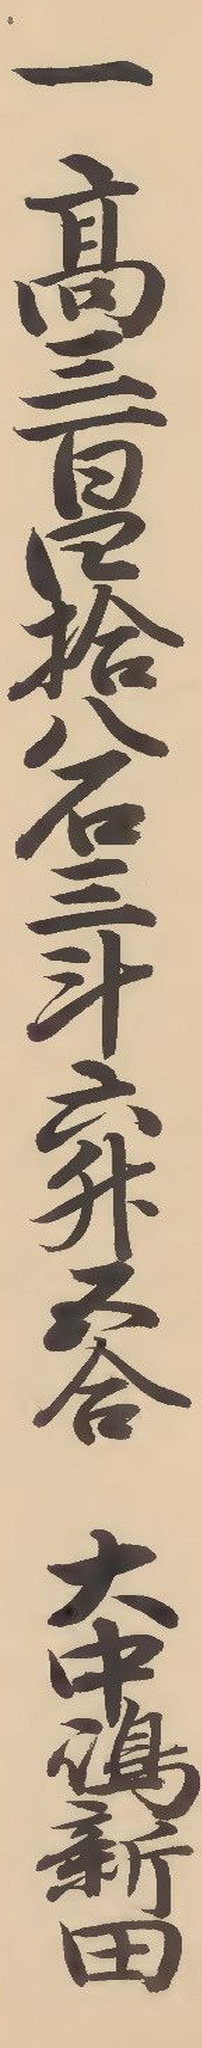一高三百四拾八石三斗六升五合大中島新田
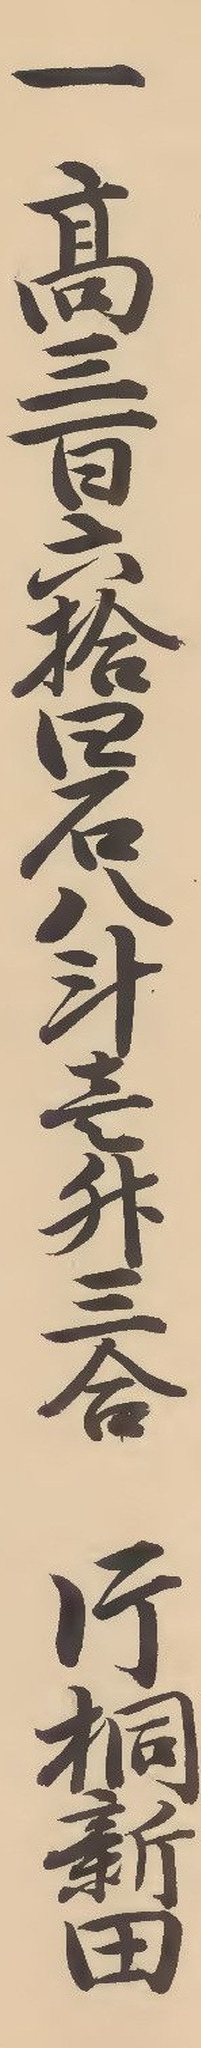一高三百六拾四石八斗壱升三合片桐新田
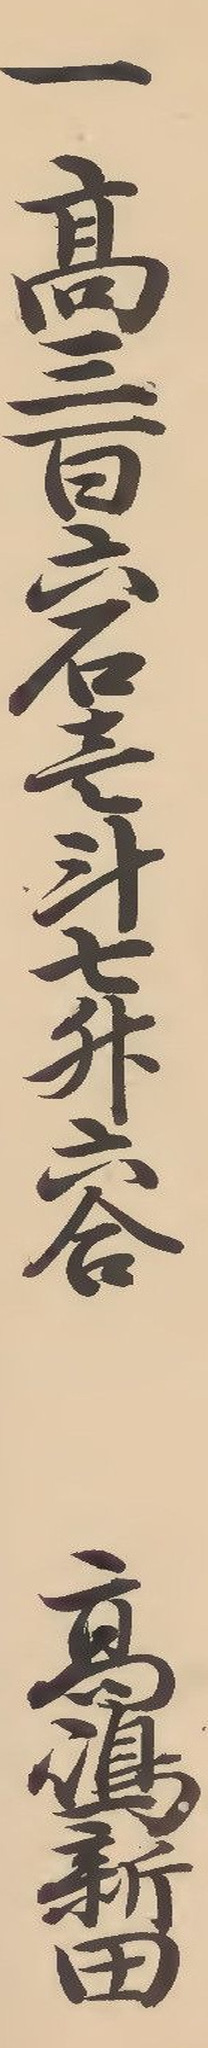一高三百六石壱斗七升六合高島新田
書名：越後国郷帳　下
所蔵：国立公文書館 National Archives of Japan
